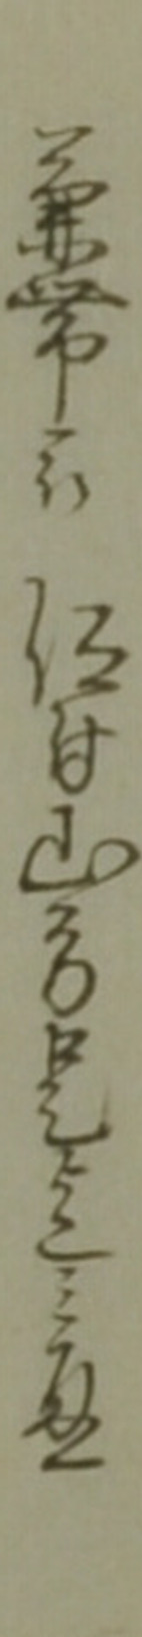兼帯被仰付山方是迄之通

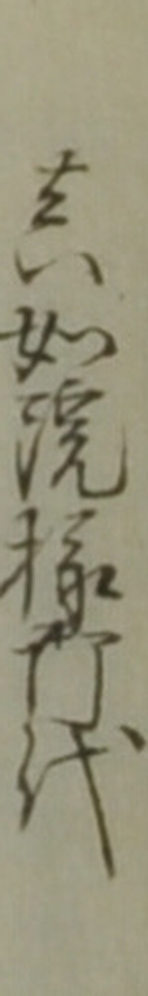真如院様御代
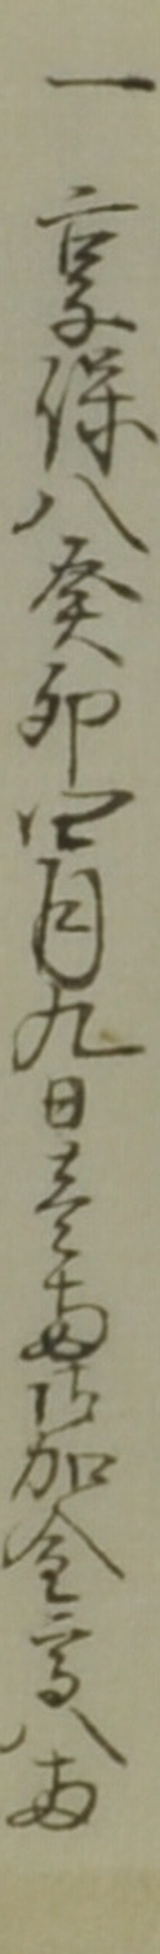一享保八癸卯四月九日壱両御加金高八両
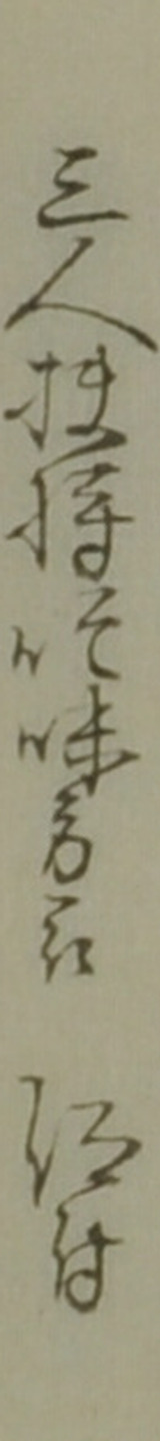三人扶持吟味方被仰付
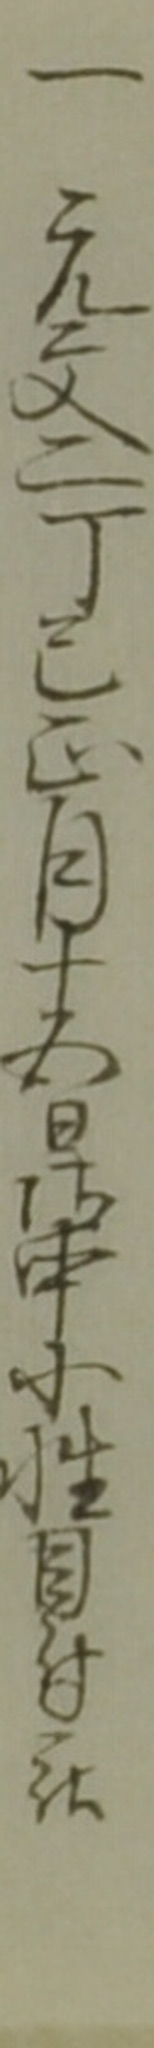一元文二丁巳正月十五日御中小性目付被
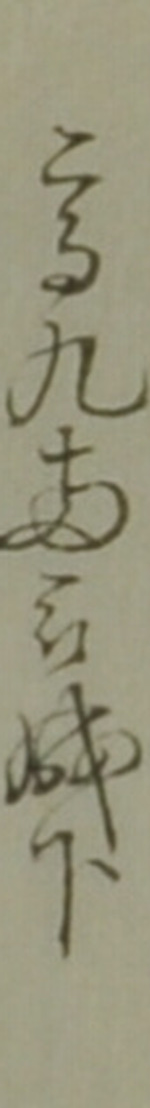高九両被成下
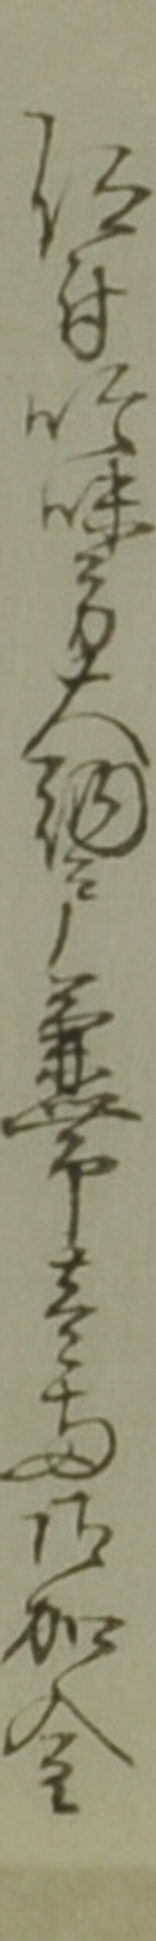仰付吟味方大納戸兼帯壱両御加金
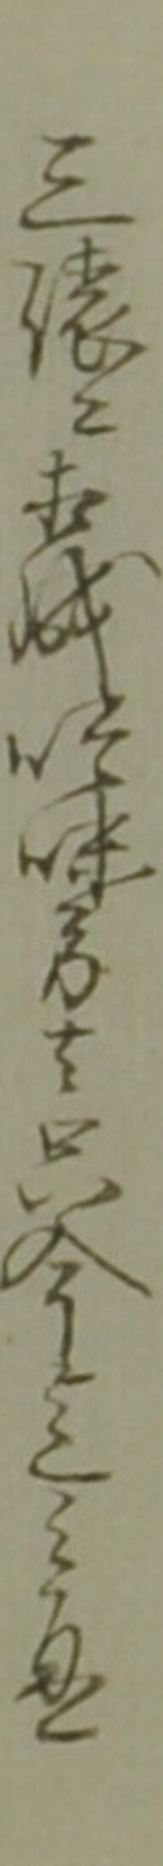三俵ニ相成吟味方者只今迄之通
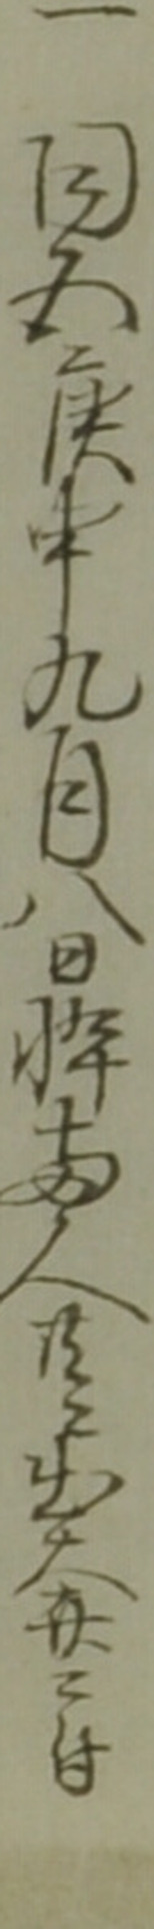一同五庚申九月八日忰両人共ニ出奔ニ付
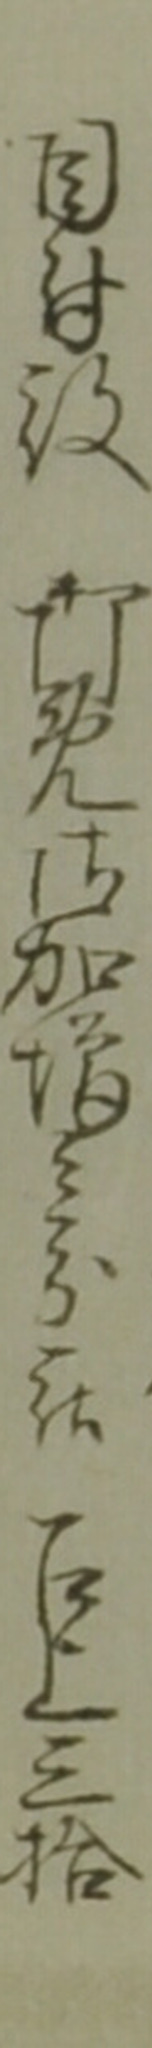目付役御免御加増之分被召上三拾
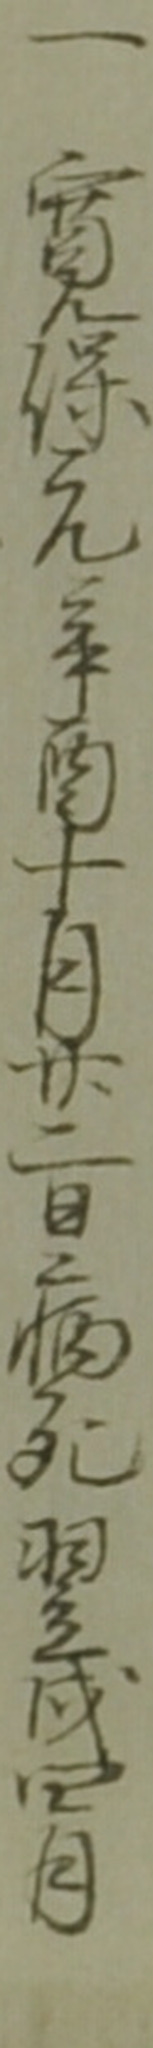一寛保元辛酉十月廿二日病死翌戌四月
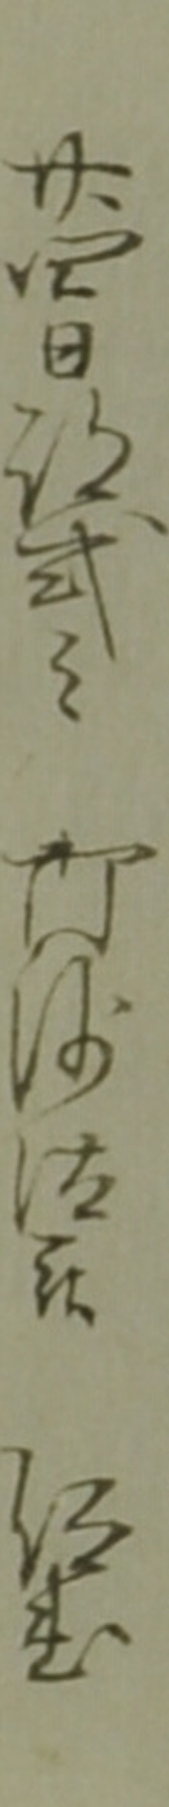廿四日跡式之御御沙汰被仰出
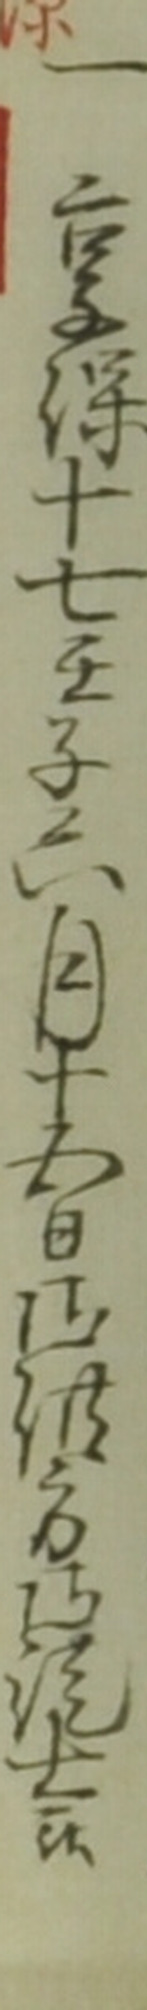一享保十七壬子六月十五日御供方御徒士被
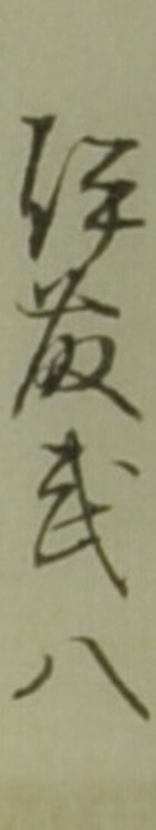伊藤武八

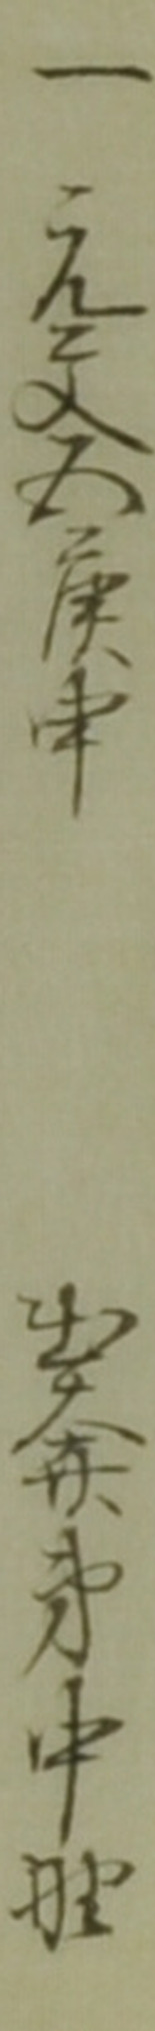一元文五庚申出奔弟中野
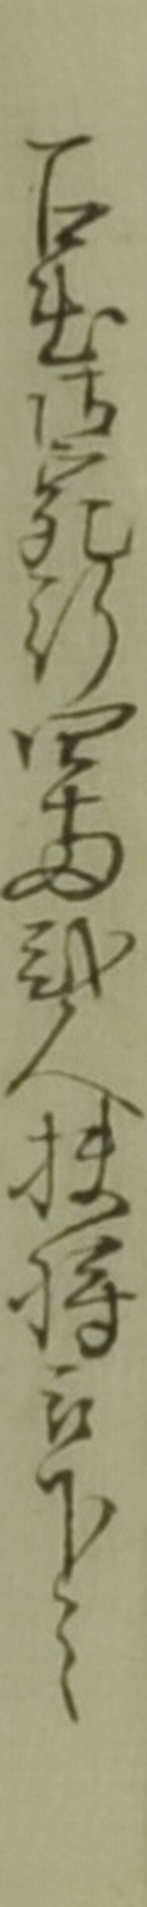召出御宛行四両弐人扶持被下之
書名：無足諸士勤仕録（一）
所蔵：伊那市立高遠町図書館・合同会社AMANE
